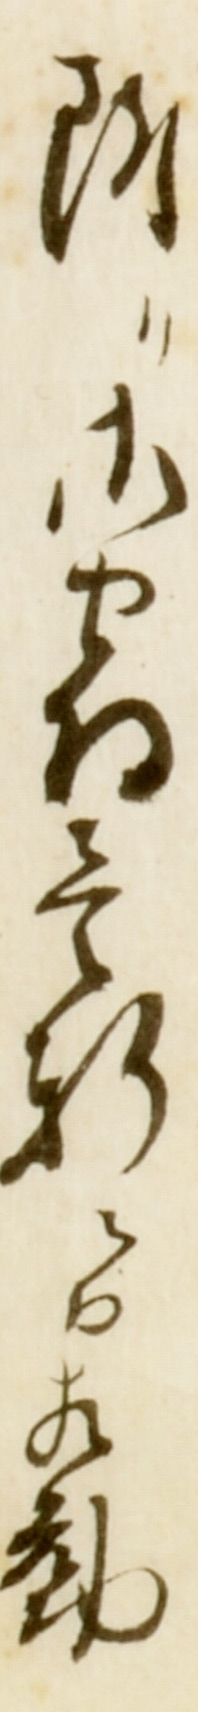附り御宿壱軒ニ而相勤
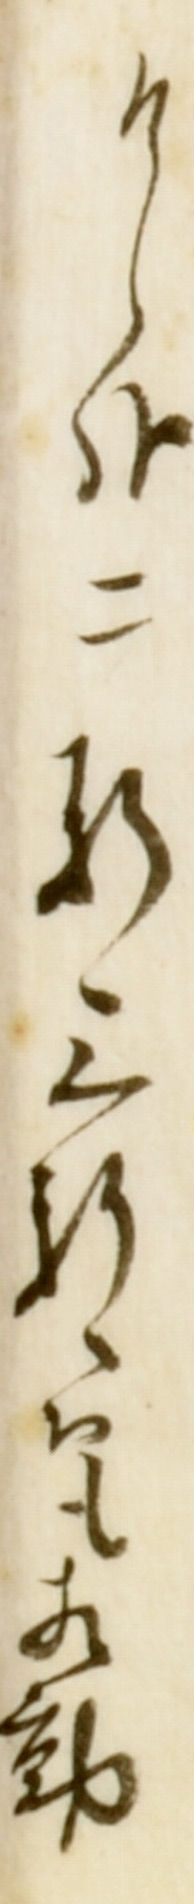有候二軒三軒ニ而も相勤
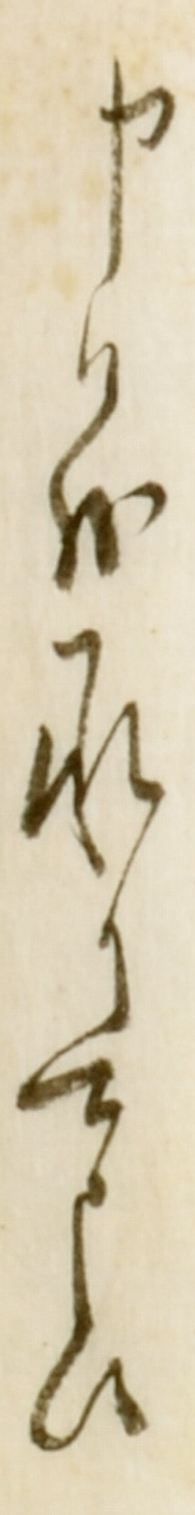申候哉承り可申候

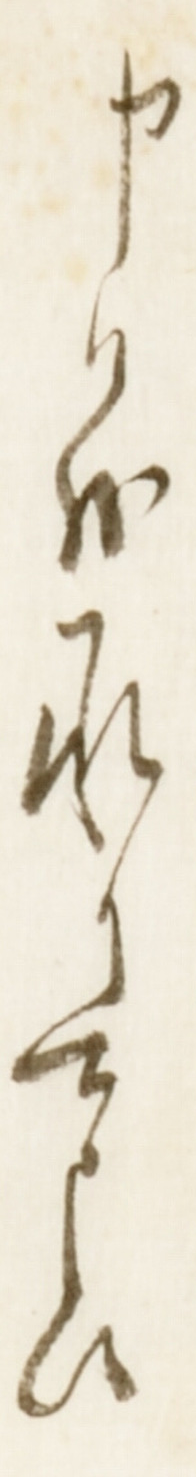申候御承り可申候
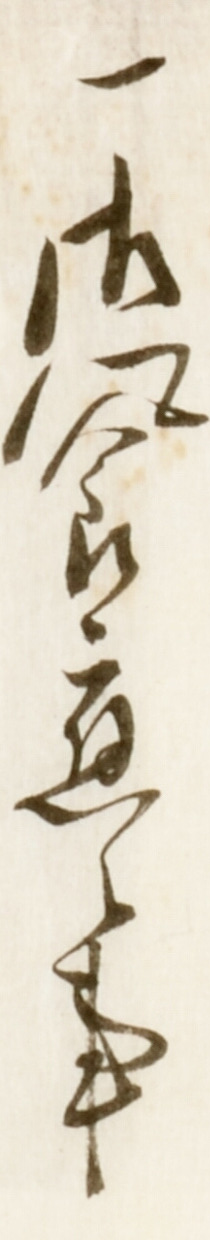一御饗良応之事
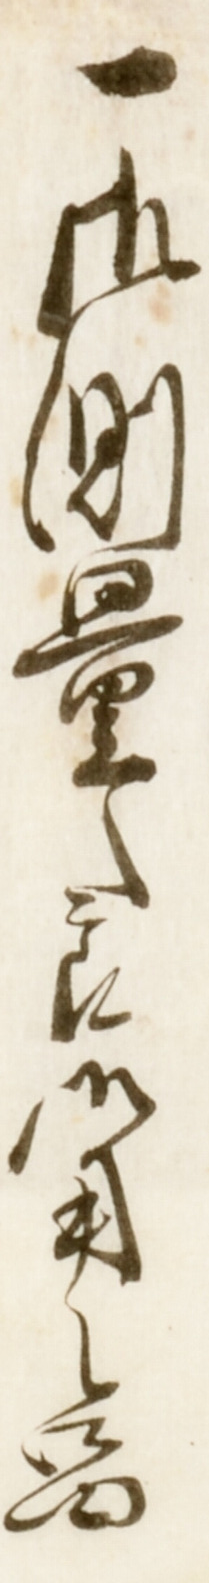一御側量之節御用之品
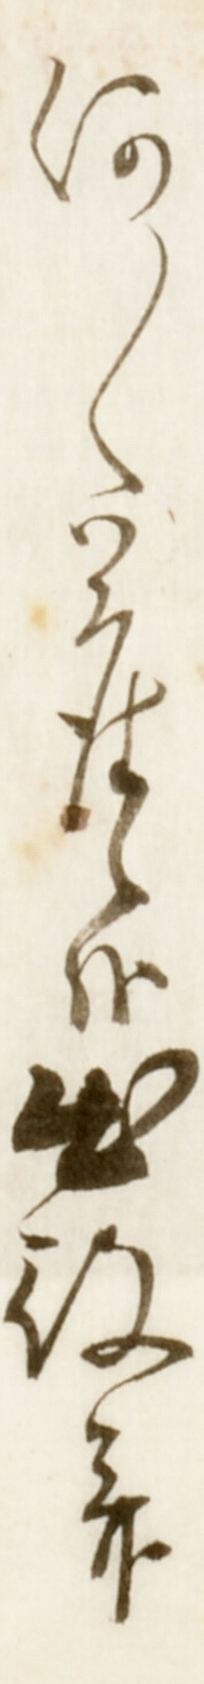何〳〵御座御出役并
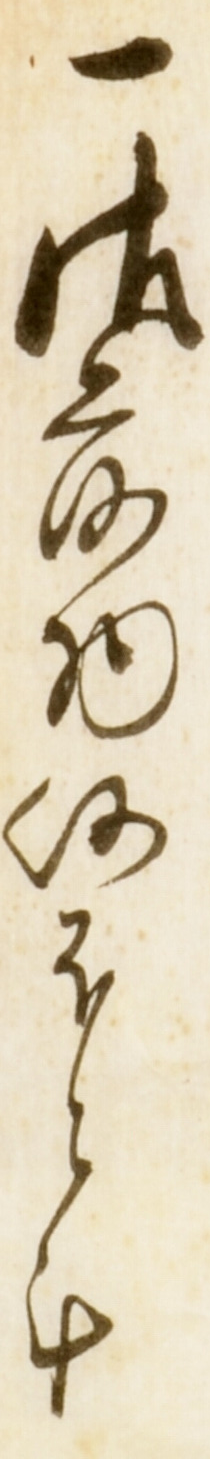一御荷物何ほと斗
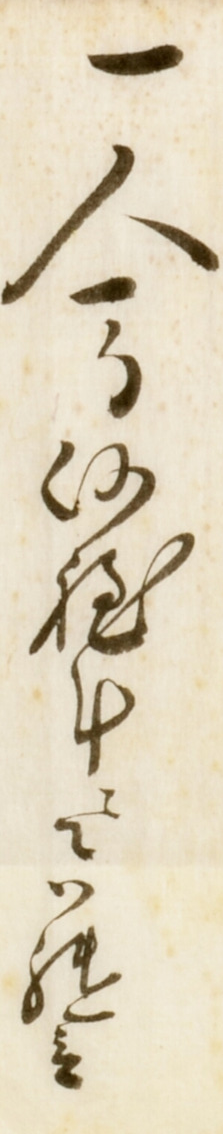一人馬何程斗ニて御継置
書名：（覚）
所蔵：伊那市立高遠町図書館・合同会社AMANE
